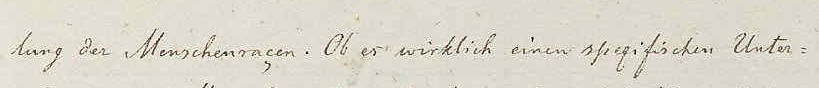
lung der Menschenraçen. Ob es wirklich einen spezifischen Unter-
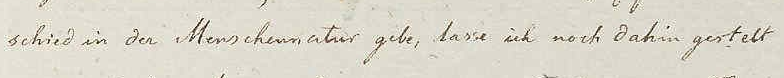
schied in der Menschennatur gebe, lasse ich noch dahin gestelt
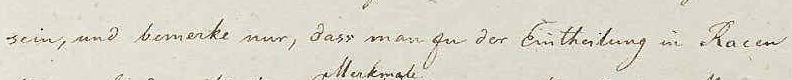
sein, und bemerke nur, dass man zu der Eintheilung in Racen
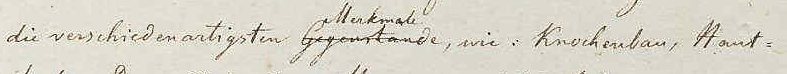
die verschiedenartigsten GegenständeMerkmale, wie: Knochenbau, Haut-
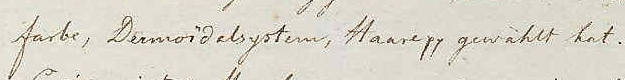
farbe, Dermoïdalsystem, Haare pp gewählt hat.
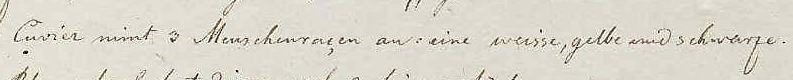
Cuvier nimt 3 Menschenraçen an: eine weisse, gelbe und schwarze.
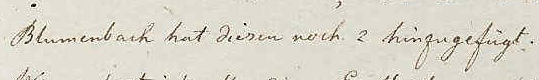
Blumenbach hat diesen noch 2 hinzugefügt.
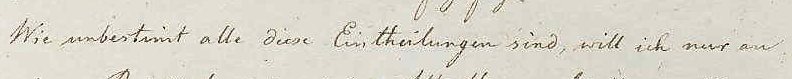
Wie unbestimt alle diese Eintheilungen sind, will ich nur an
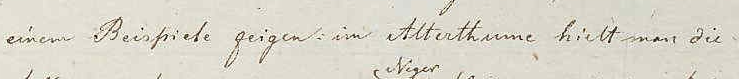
einem Beispiele zeigen: im Alterthume hielt man die
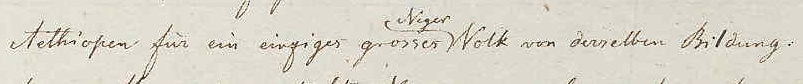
Aethiopen für ein einziges grosses NegerVolk von derselben Bildung:
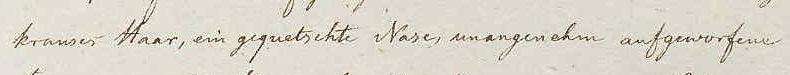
krauses Haar, ein gequetschte Nase, unangenehm aufgeworfene
